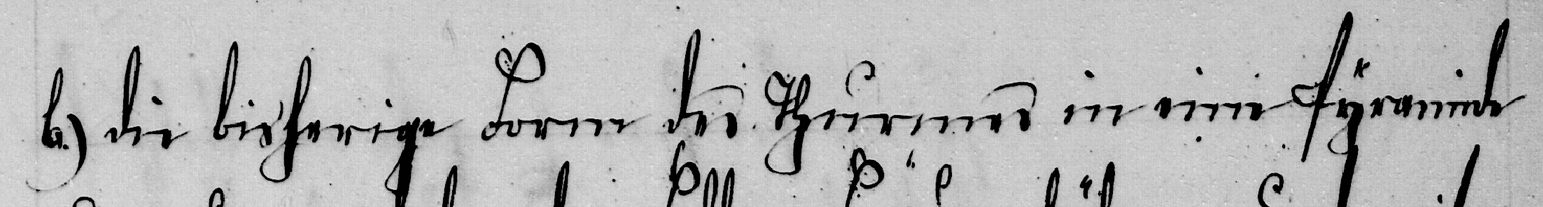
b.) die bisherige Form des Thurmes in eine Pyrmide
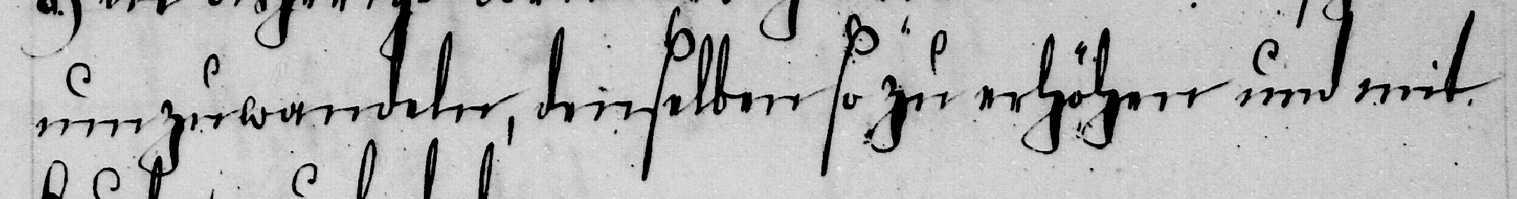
umzuwandeln, denselben so zu erhöhen und mit
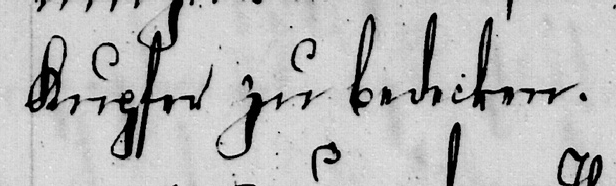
Kupfer zu bedecken.
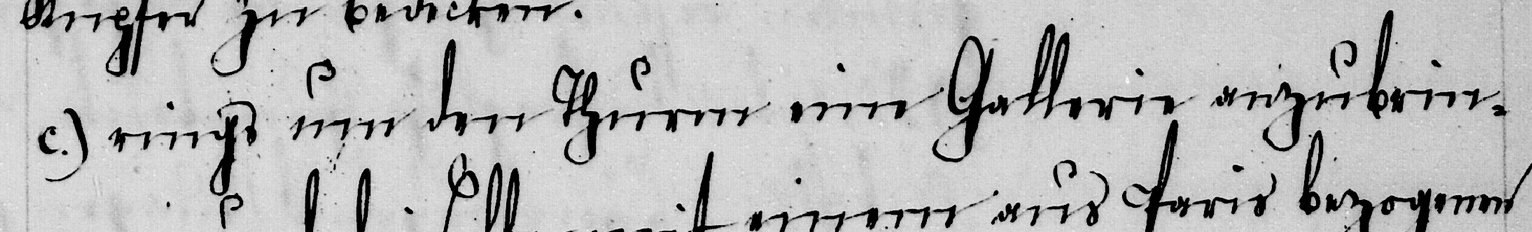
c.) rings um den Thurm eine Gallerie anzubrin¬
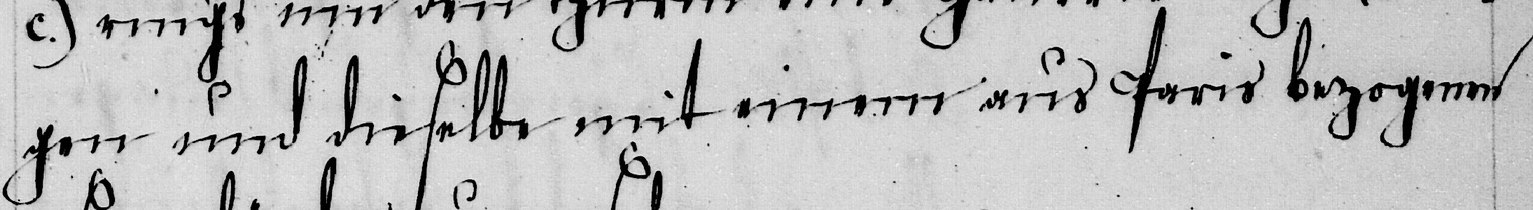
gen und dieselbe mit einem aus Paris bezogenen
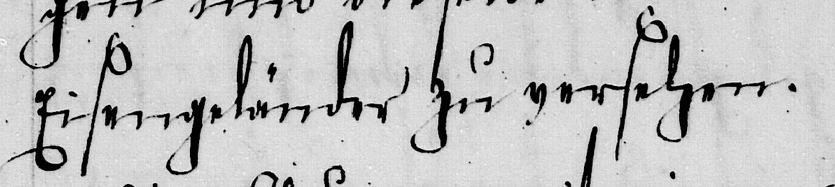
Eisengeländer zu versehen.
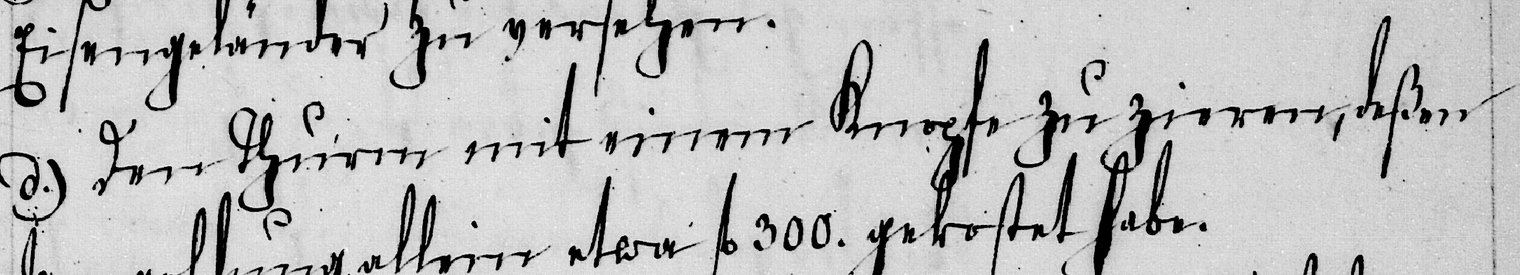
d.) Den Thurm mit einem Knopfe zu zieren, deßen
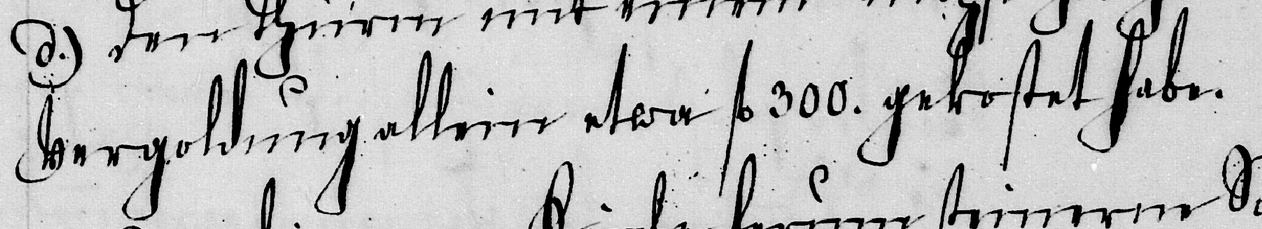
Vergoldung allein etwa fl. 300 gekostet habe.
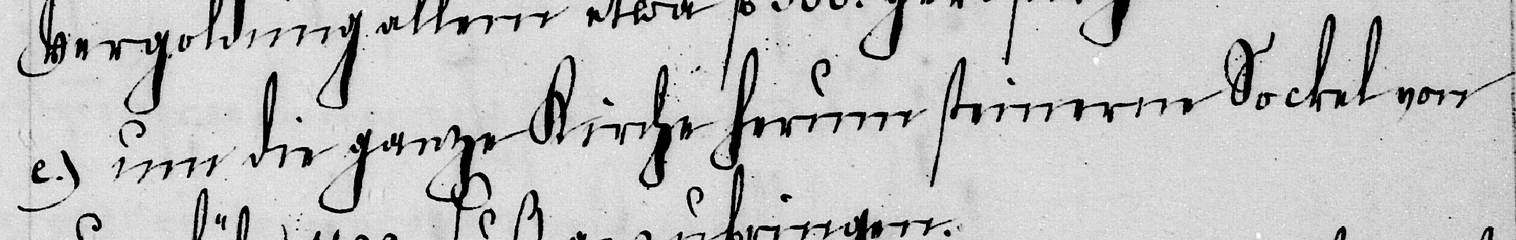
e.) um die ganze Kirche herum steinerne Sockel von
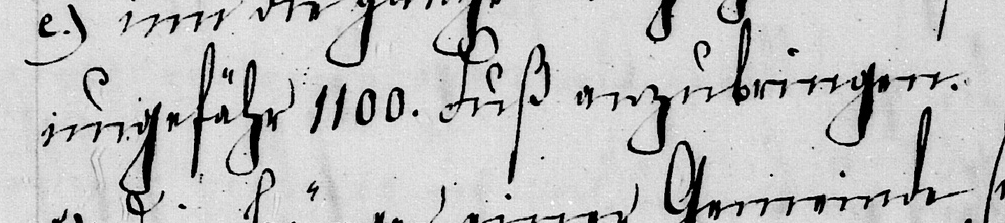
ungefähr 1100. Fuß anzubringen.
